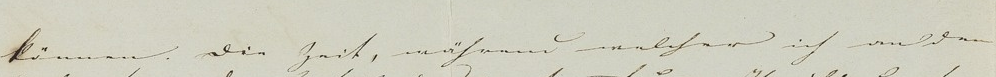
können. Die Zeit, während welcher ich an den
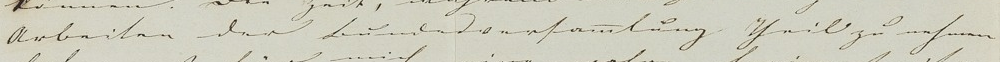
Arbeiten der Bundesversammlung Theil zu nehmen
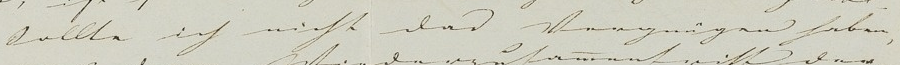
Sollte ich nicht das Vergnügen haben,
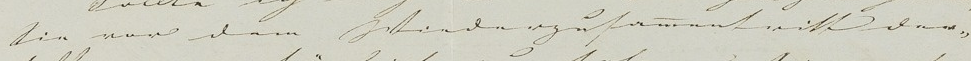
Sie vor dem Wiederzusammentritt der-
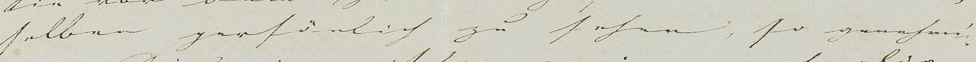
selben persönlich zu sehen, so genehmi-
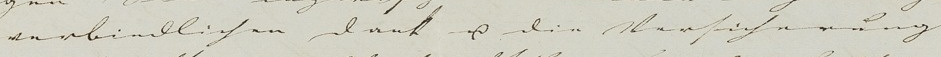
verbindlichen Dank & die Versicherung
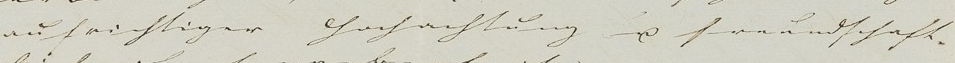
aufrichtiger Hochachtung & freundschaft-
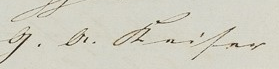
G. A. Keiser
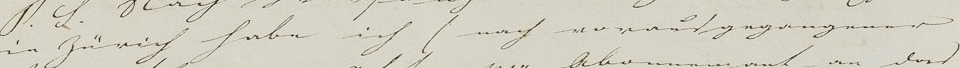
in Zürich habe ich (nach vorausgegangener
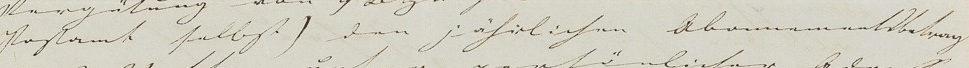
Postamt selbst) den jährlichen Abonnementsbetrag
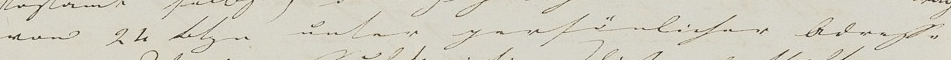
von 24 Btzn unter persönlicher Adresse
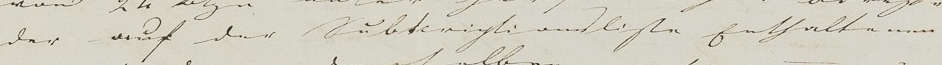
der auf der Subscriptionsliste Enthaltenen
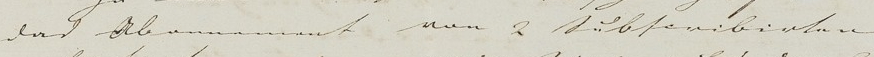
das Abonnement von 2 Subscribirten
